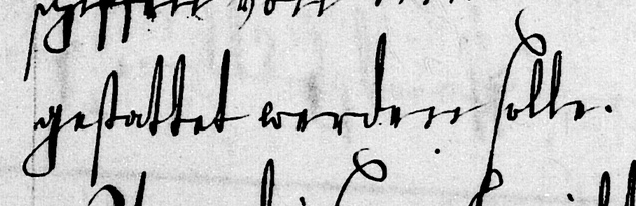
gestattet werden solle.
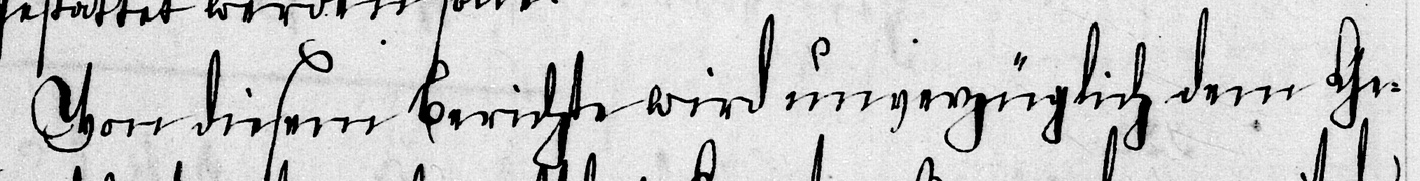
Von diesem Berichte wird unverzüglich dem Ge¬
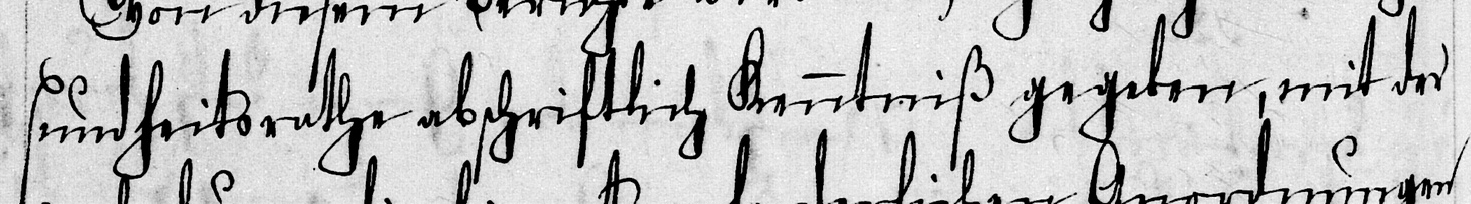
sundheitsrathe abschriftlich Kenntniß gegeben, mit der
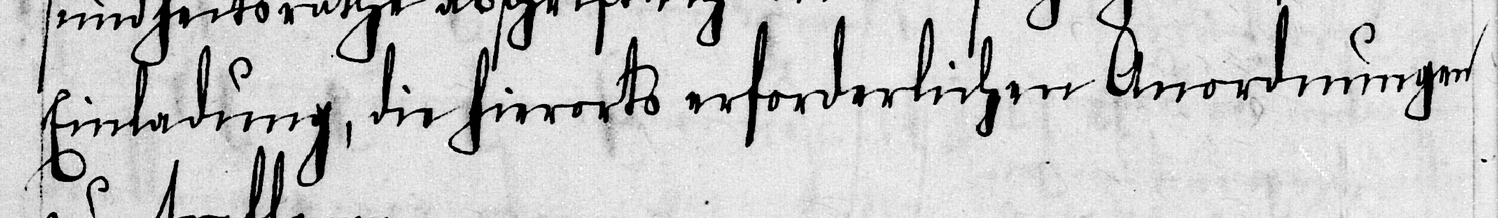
Einladung, die hierorts erforderlichen Anordnungen
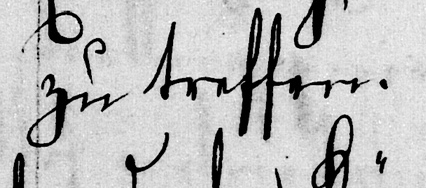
zu treffen.
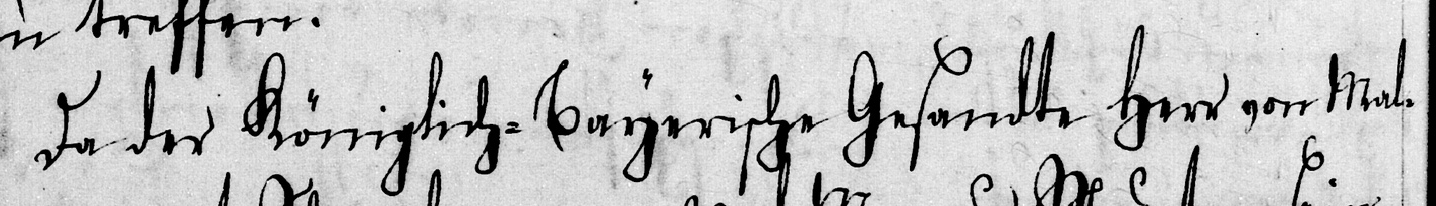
Da der Königlich-Bayerische Gesandte Herr von Mal¬
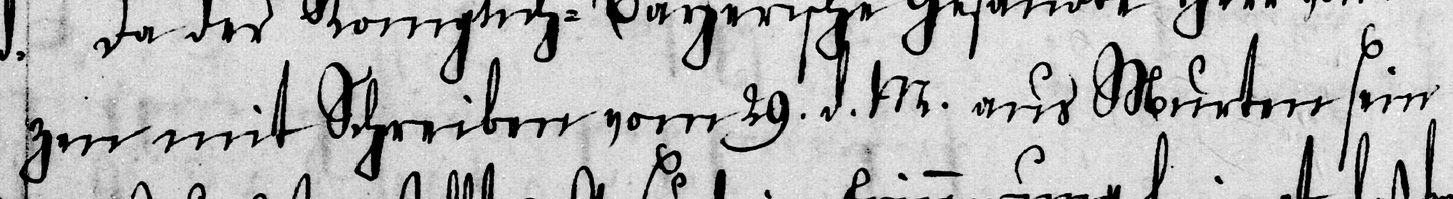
zen mit Schreiben vom 29. d. M. aus Murten sein
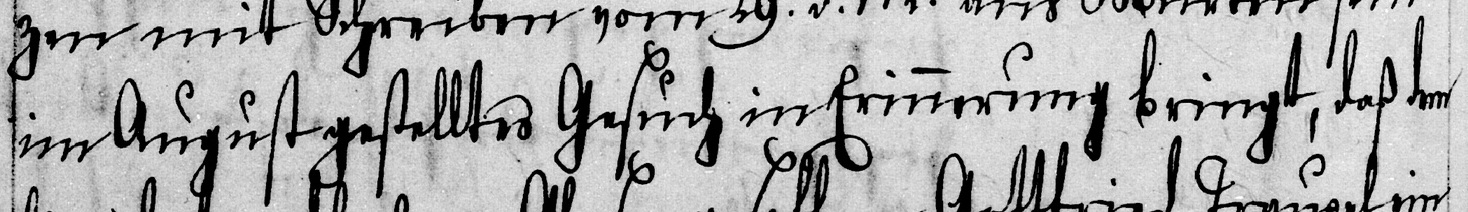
im August gestelltes Gesuch in Erinnerung bringt, daß dem
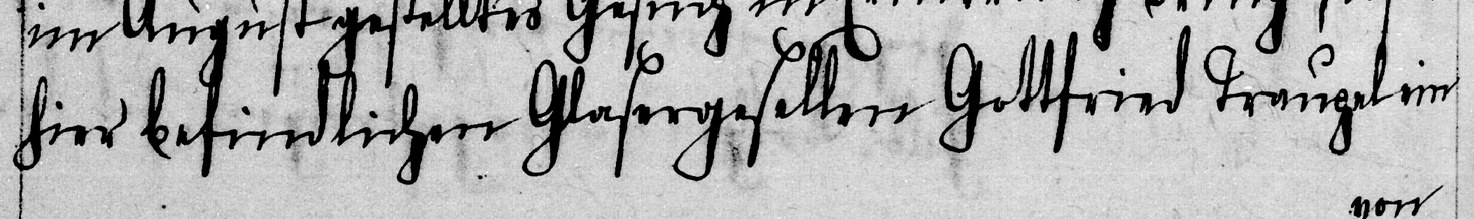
hier befindlichen Glasergesellen Gotffried Traupel ein
